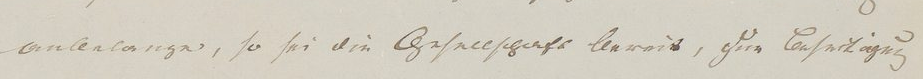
anbelange, so sei die Gesellschaft bereit, zur Beseitigung
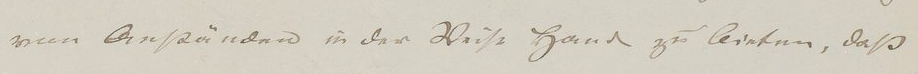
von Anständen in der Weise Hand zu bieten, daß
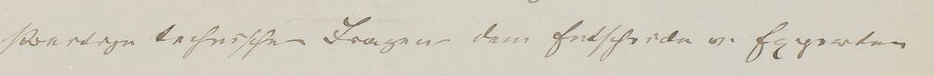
streitige technische Fragen dem Entscheide v. Experten
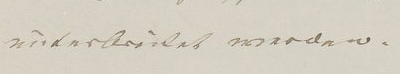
unterbreitet werden. –
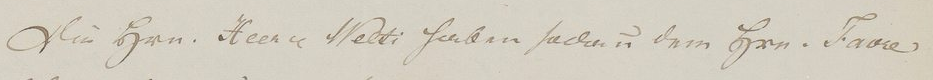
Die Hrn. Heer u. Welti haben sodann dem Hrn. Favre
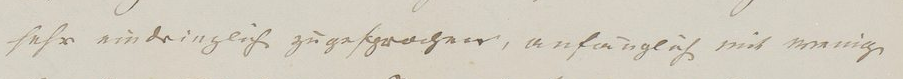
sehr eindringlich zugesprochen, anfänglich mit wenig
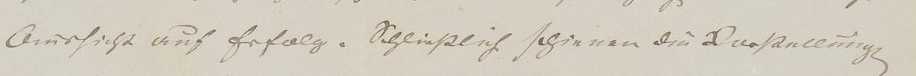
Aussicht auf Erfolg. Schließlich schienen die Vorstellungen
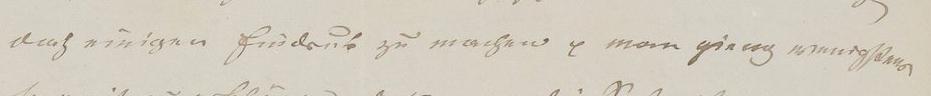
doch einigen Eindruck zu machen u. man gieng wenigstens
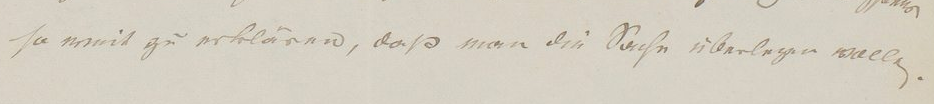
so weit zu erklären, daß man die Sache überlegen wolle.
